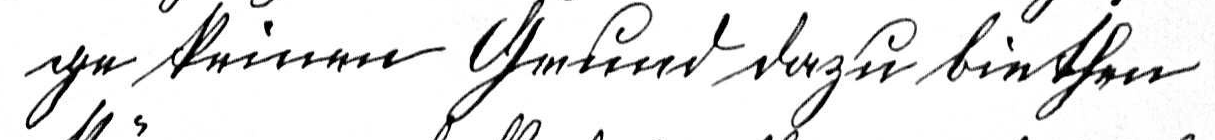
ge keinen Grund dazu biethen
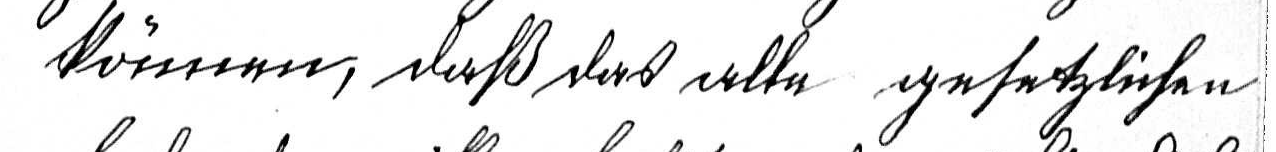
können, daß das alte gesetzlichen
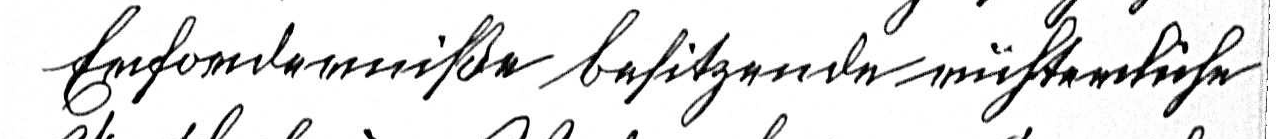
Erforderniße besitzende richterliche
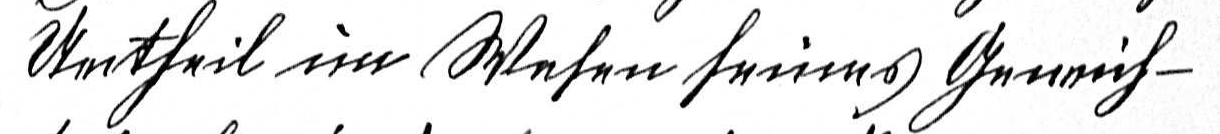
Urtheil im Wesen seines Gerich¬
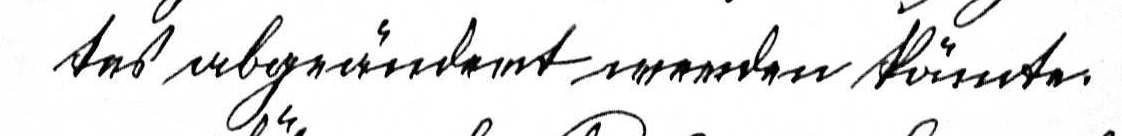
tes abgeändert werden könnte.
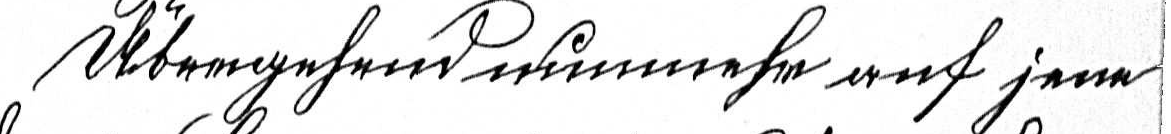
Übergehend nunmehr auf jene
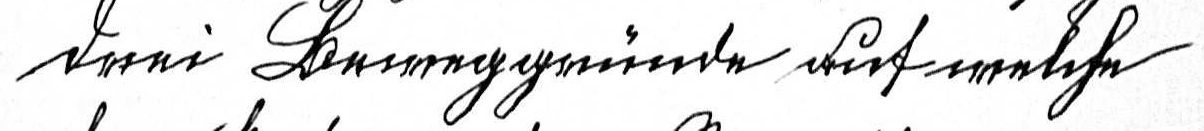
drei Beweggründe auf welche
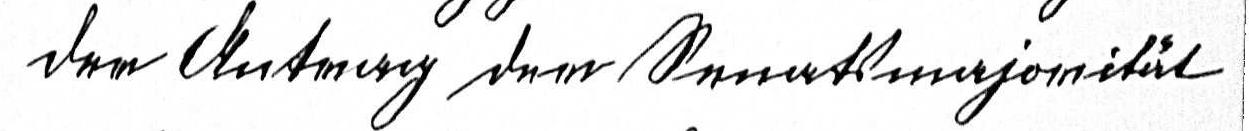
der Antrag der Senatsmajorität
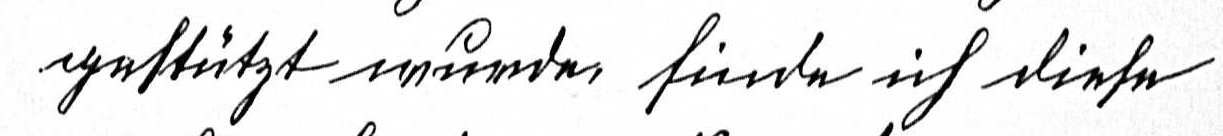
gestützt wurde, finde ich diese
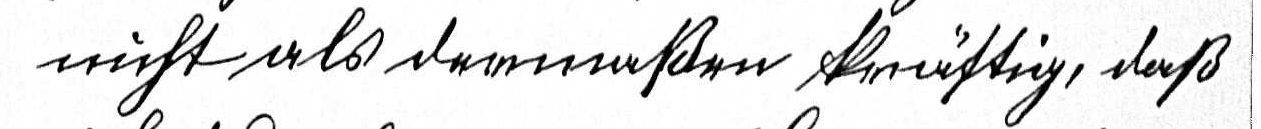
nicht als dermaßen kräftig, daß
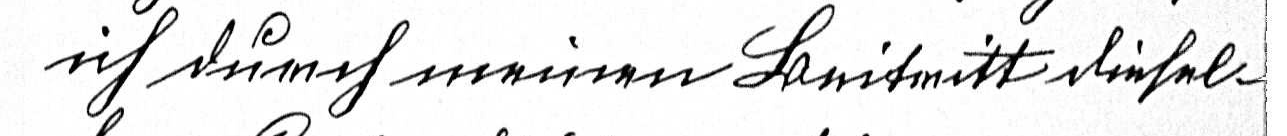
ich durch meinen Beitritt diesel¬
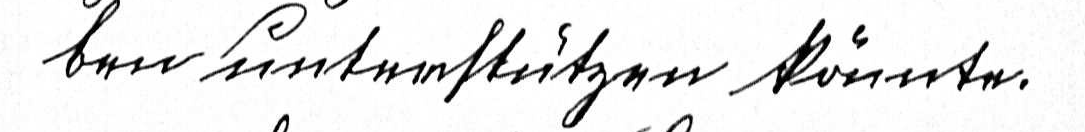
ben unterstützen könnte.
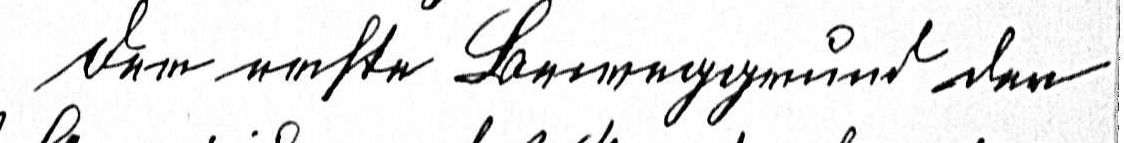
Der erste Beweggrund der
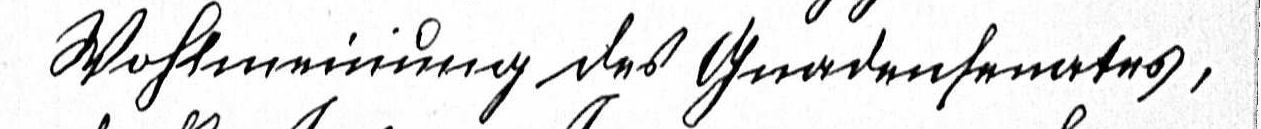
Wohlmeinung des Gnadensenates,
